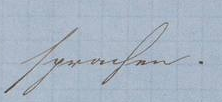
sprachen.
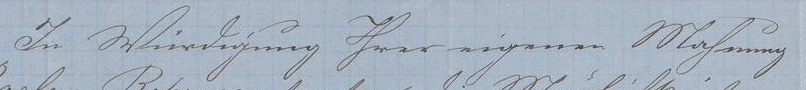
In Würdigung Ihrer eigenen Mahnung
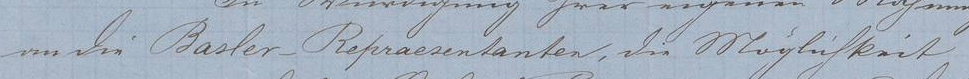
an die Basler-Repraesentanten, die Möglichkeit
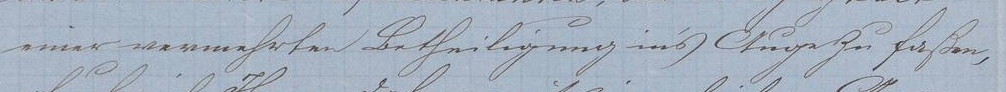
einer vermehrten Betheiligung in's Auge zu faßen,
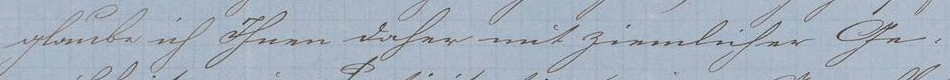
glaube ich Ihnen daher mit ziemlicher Ge-
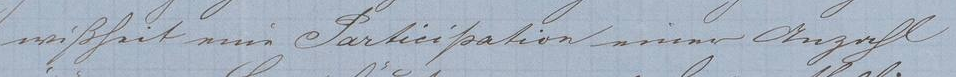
wißheit eine Participation einer Anzahl
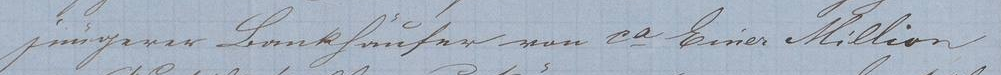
jüngerer Bankhäuser von ca Einer Million
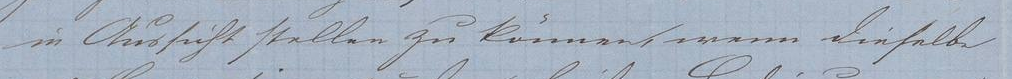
in Aussicht stellen zu können, wenn dieselbe
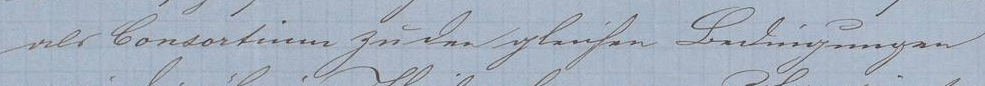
als Consortium zu den gleichen Bedingungen
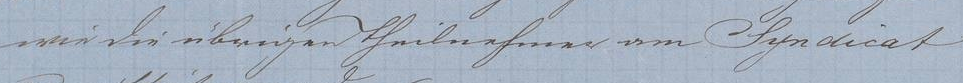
wie die übrigen Theilnehmer am Syndicat
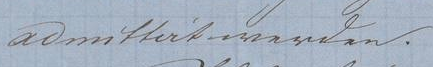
admittirt werden.
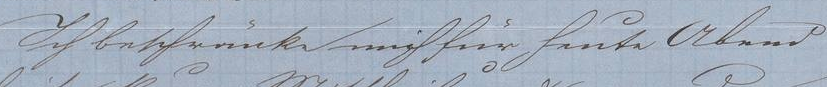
Ich beschränke mich für heute Abend
